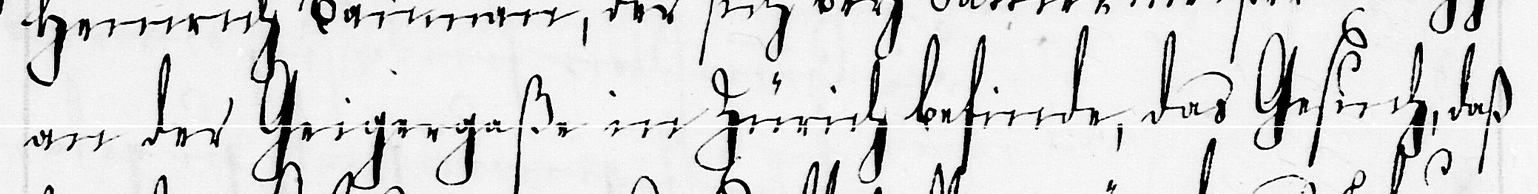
an der Geigergaße in Zürich befinde, das Gesuch, daß
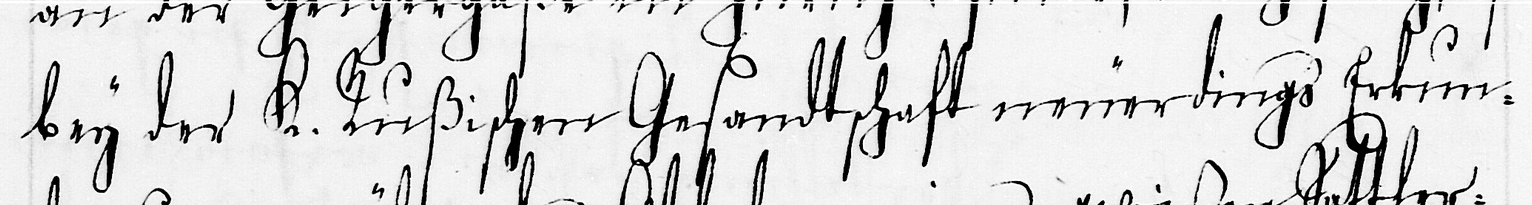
bey der K. Rußischen Gesandtschaft neuerdings Erkun¬
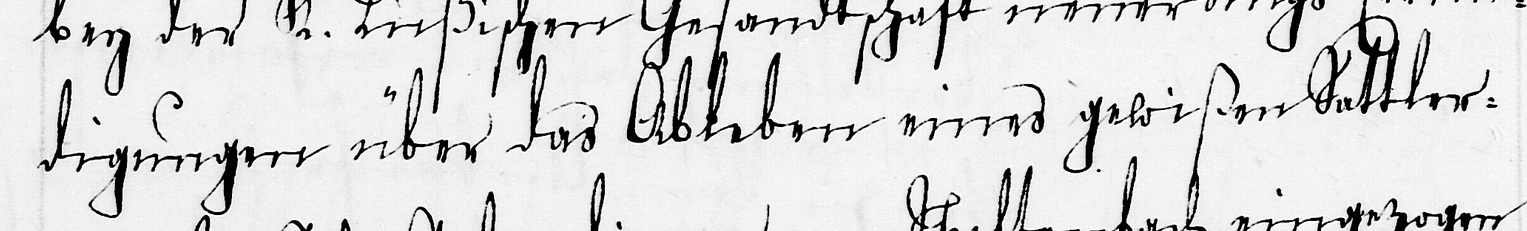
digungen über das Ableben eines gewißen Sattler¬
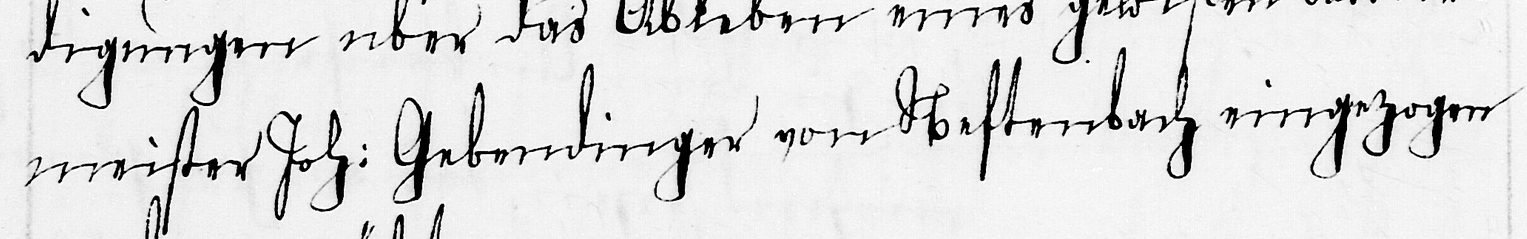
meister Joh. Gebendinger von Neftenbach eingezogen
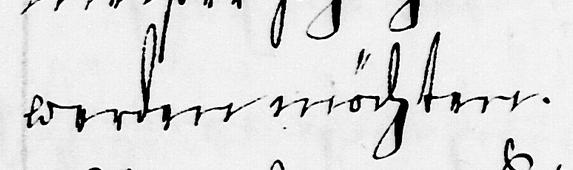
werden möchten.
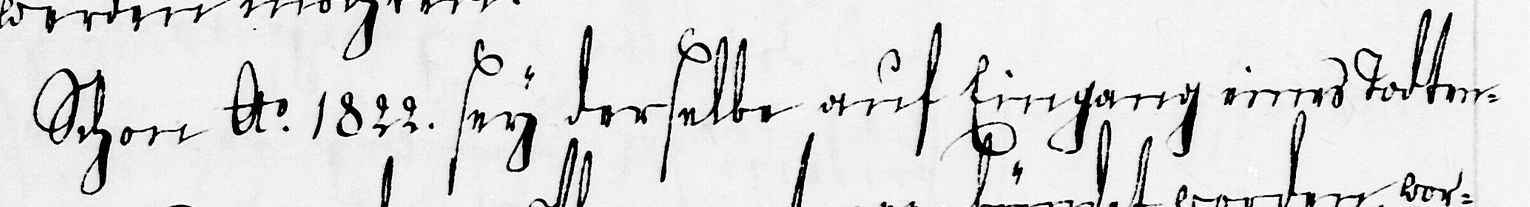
Schon Ao. 1822. sey derselbe auf Eingang eines Todten¬
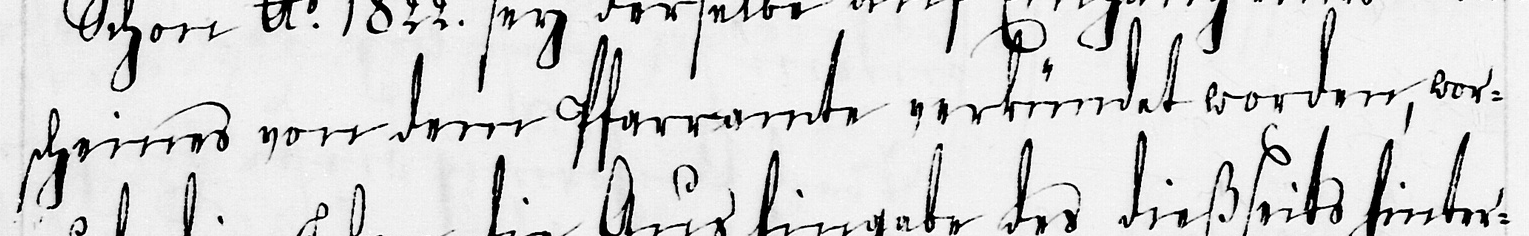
scheines von dem Pfarramte verkündet worden, wor¬
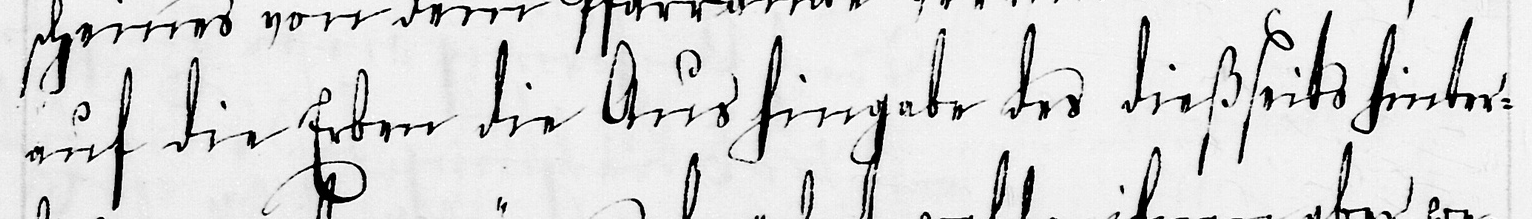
auf die Erben die Aushingabe des dießseits hinte¬
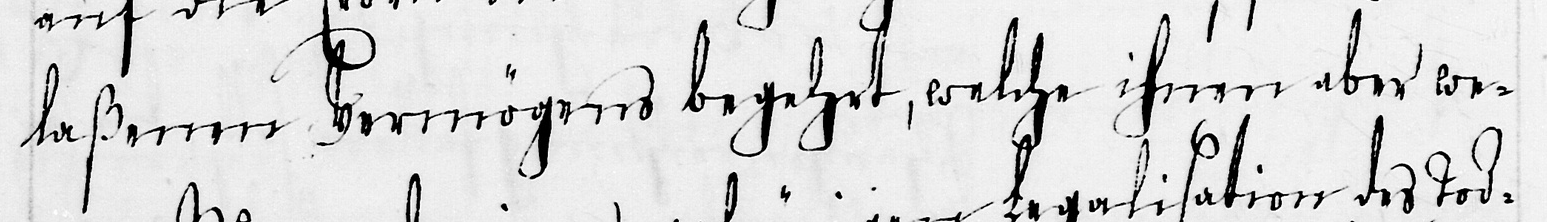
rlaßenen Vermögens begehrt, welche ihnen aber we¬
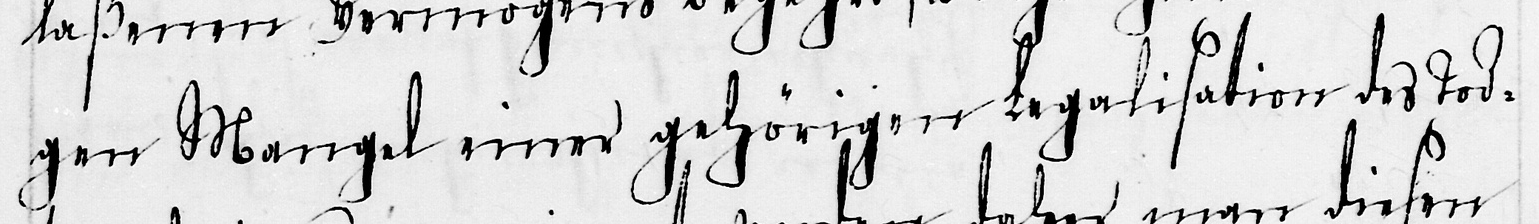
gen Mangel einer gehörigen Legalisation des Tod¬
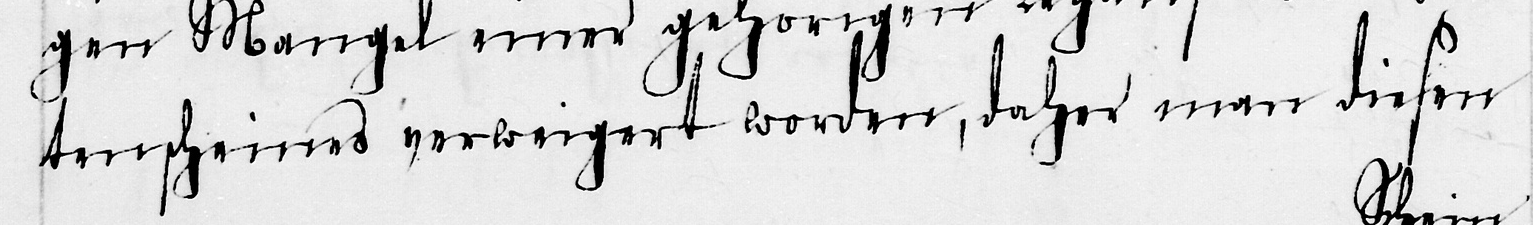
tenscheines verweigert worden, daher man diesen
